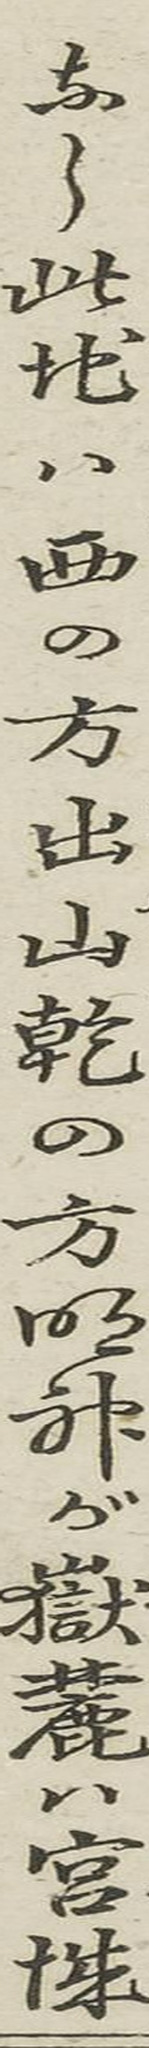なし此地は西の方出山乾の方明神が嶽麓は宮城

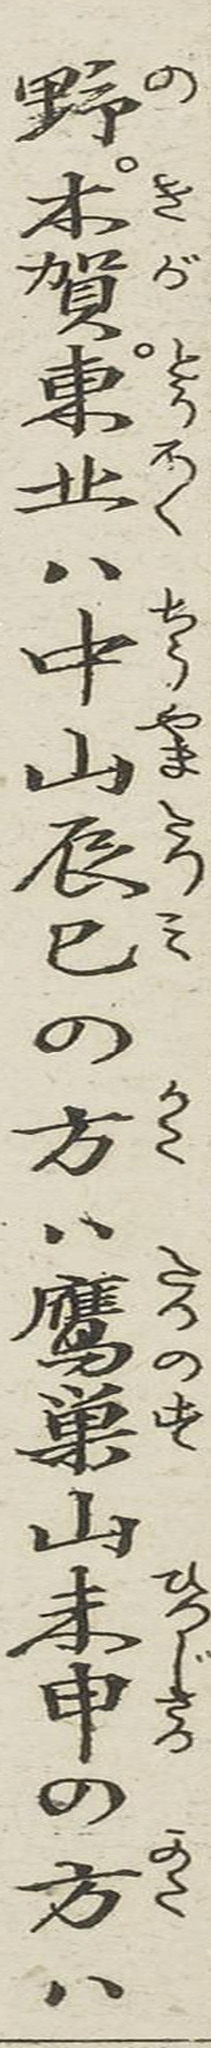野。木賀。東北は中山辰巳の方は鷹巣未申の方は
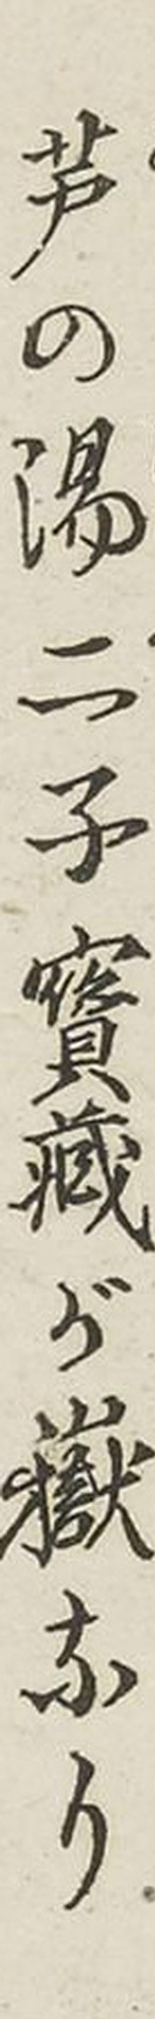芦の湯二子宝蔵が嶽なり
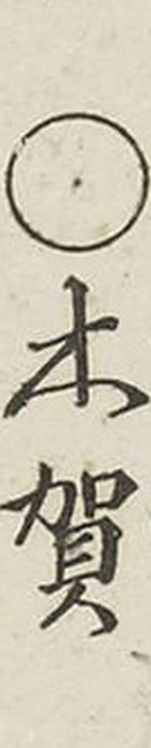〇木賀
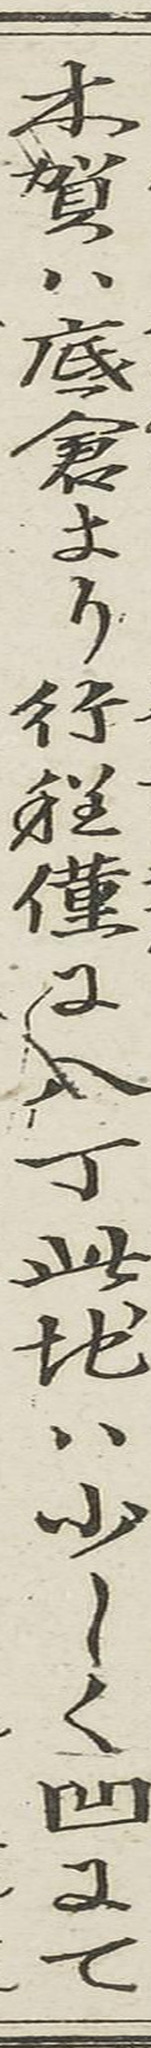木賀は底倉より行程僅に八丁此地は少しく凹にて
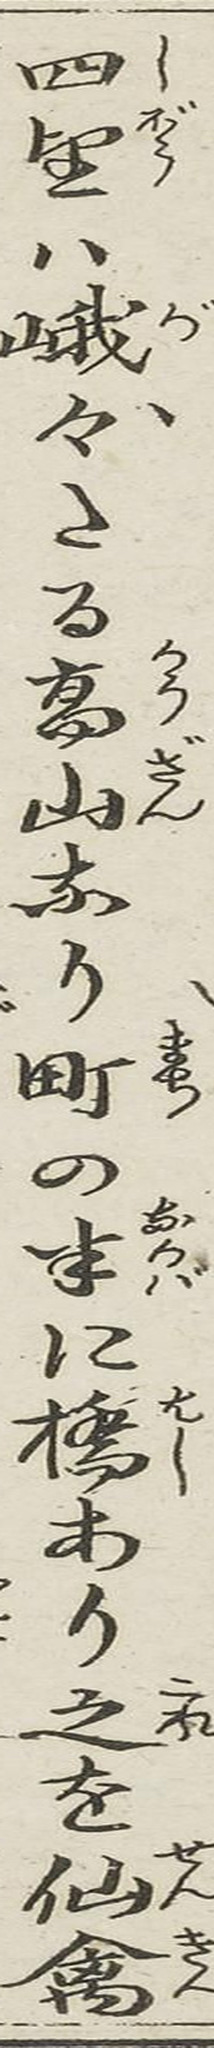四望は峨々たる高山なり町の半に橋あり之を仙禽
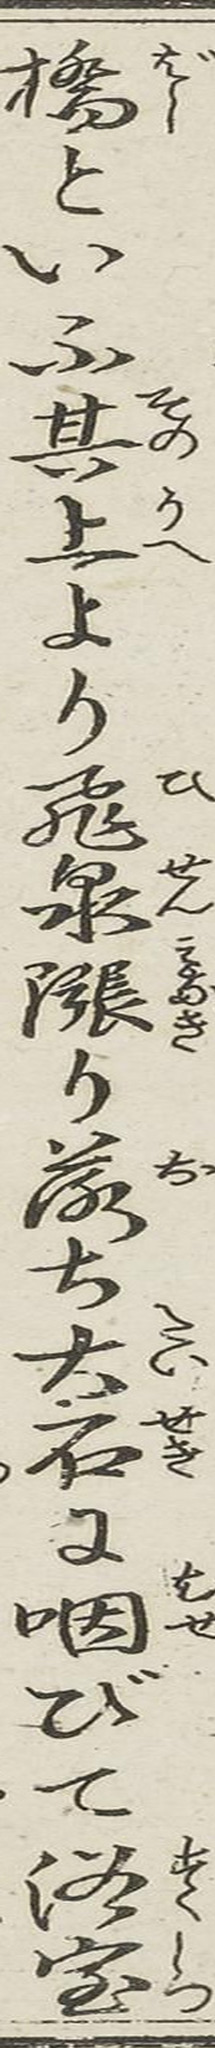橋といふ其上より飛泉漲り落ち大石に咽びて浴室
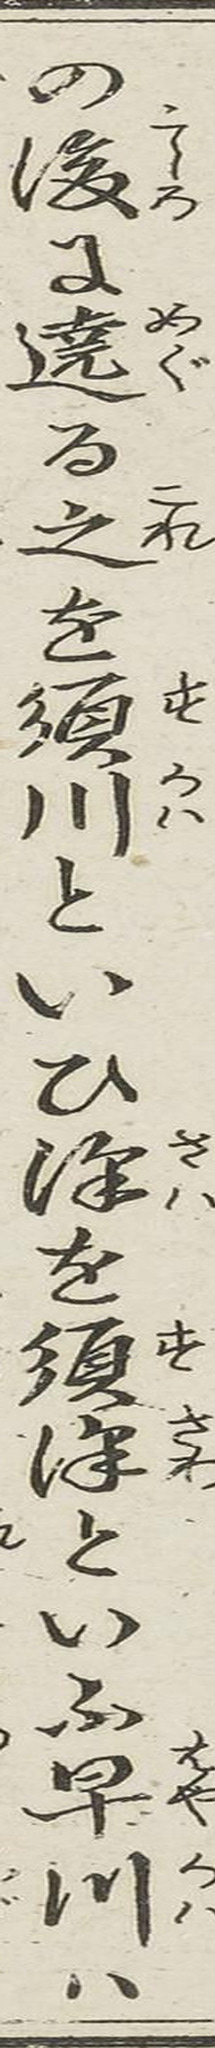の後に遶る之を須川といひ沢を須沢といふ早川は
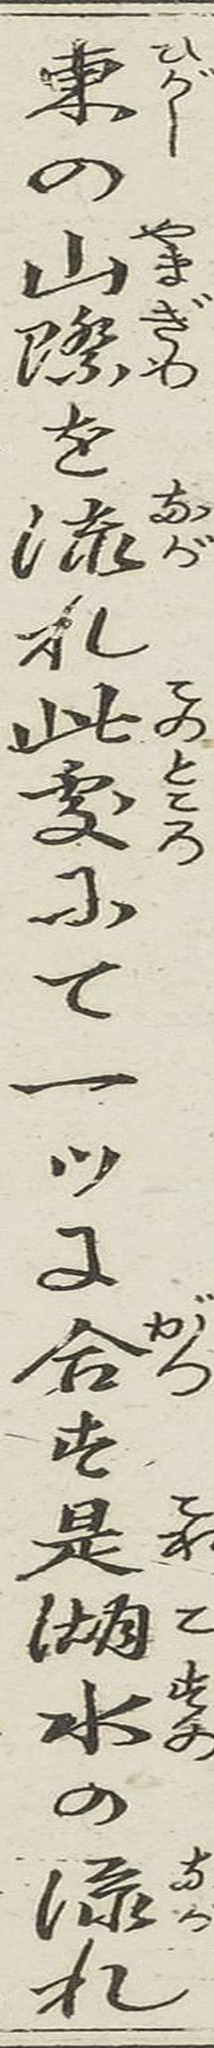東の山際を流れ此処にて一ツに合す是湖水の流れ
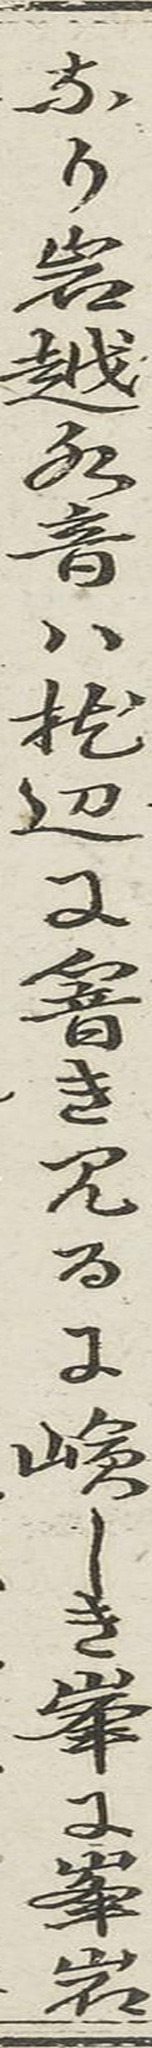なり岩越水音は枕辺に響き見るに嶮しき峯に峯岩
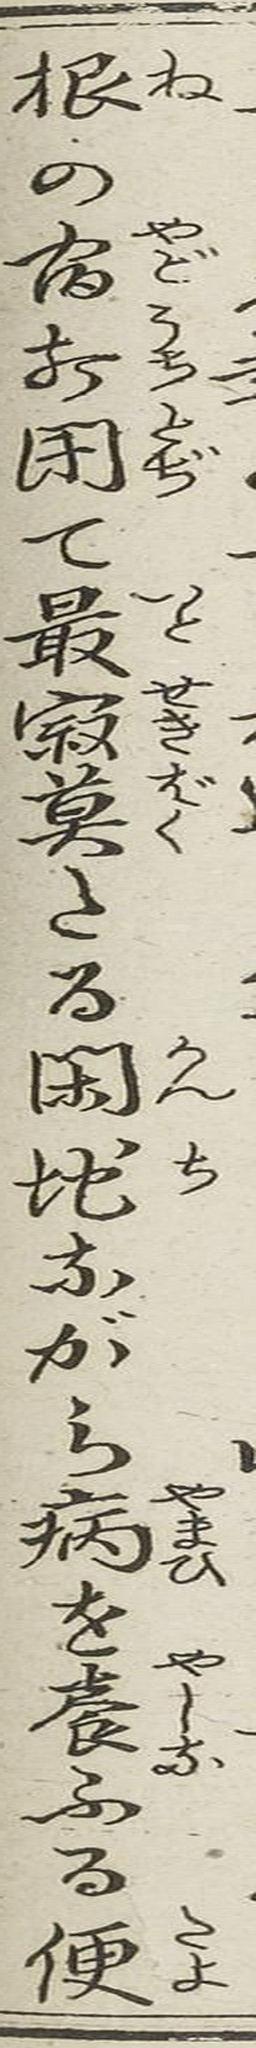根の宿打閉て最寂寞たる閑地ながら病を養ふる便
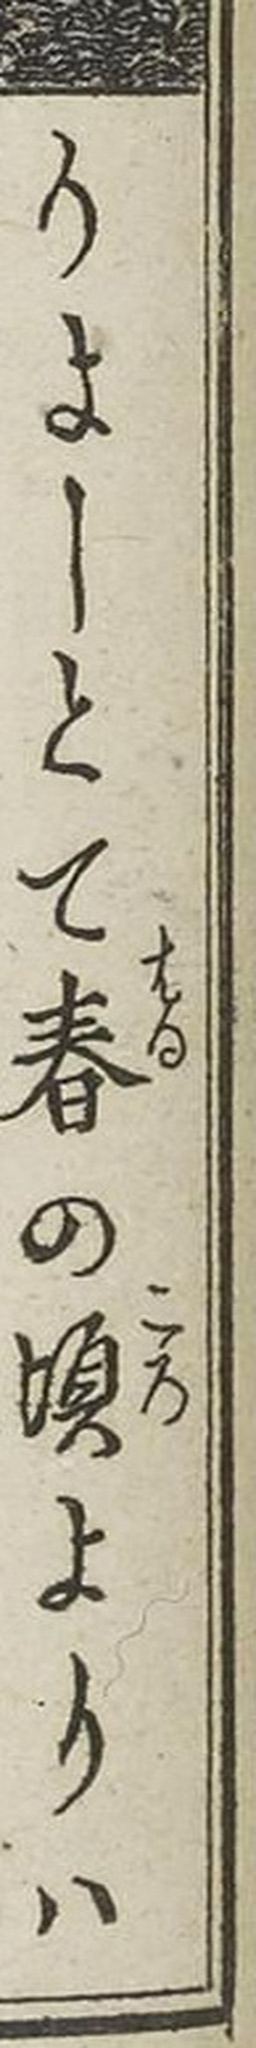りよしとて春の頃よりは
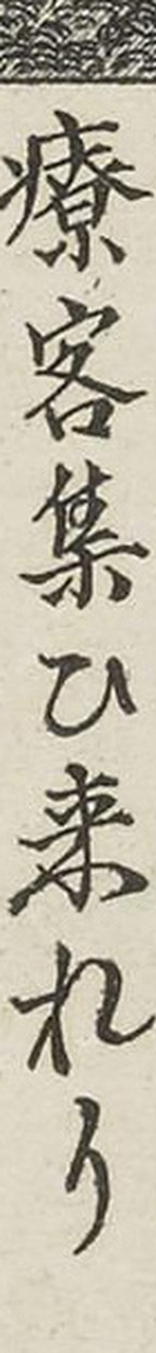療客集ひ来れり
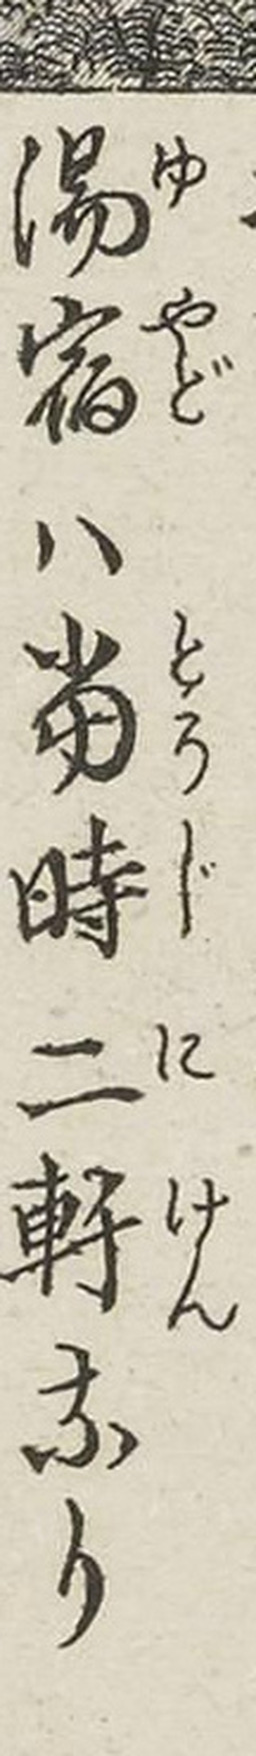湯宿は当時二軒なり
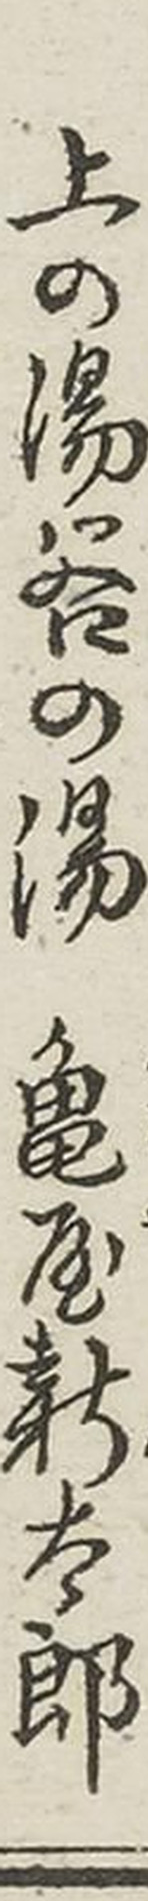上の湯谷の湯亀屋新太郎
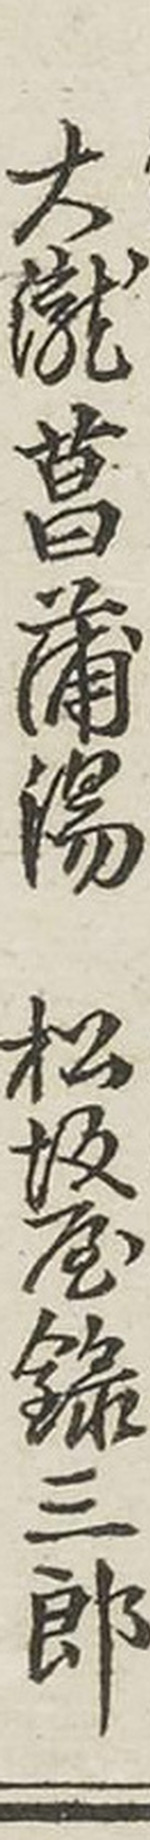大瀧菖蒲湯松坂屋録三郎
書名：箱根温泉誌　全
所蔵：東京大学地震研究所図書室 Earthquake Research Institute Library, The University of Tokyo, JAPAN
